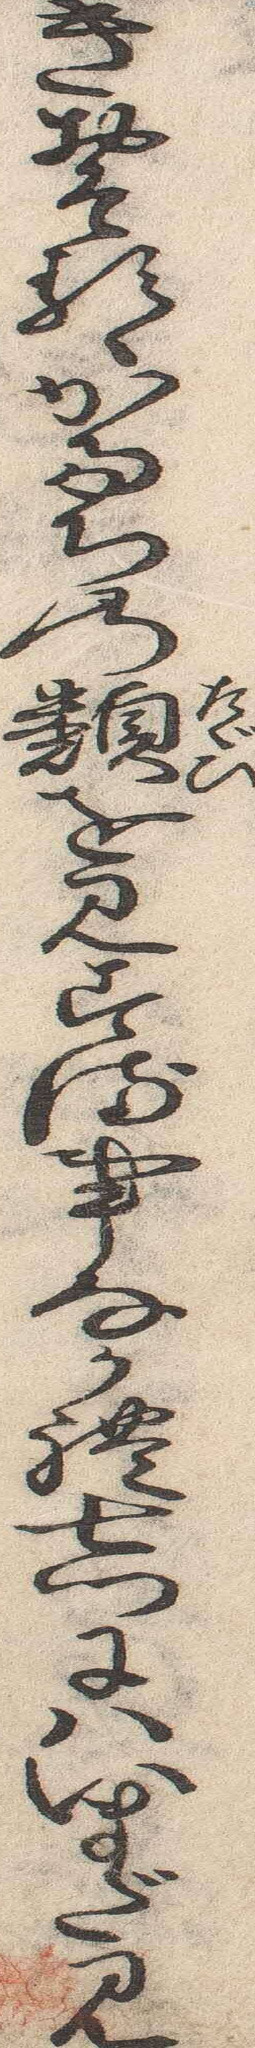きおそるゝかたちの類を見する事なかれ七つにはいまだ見
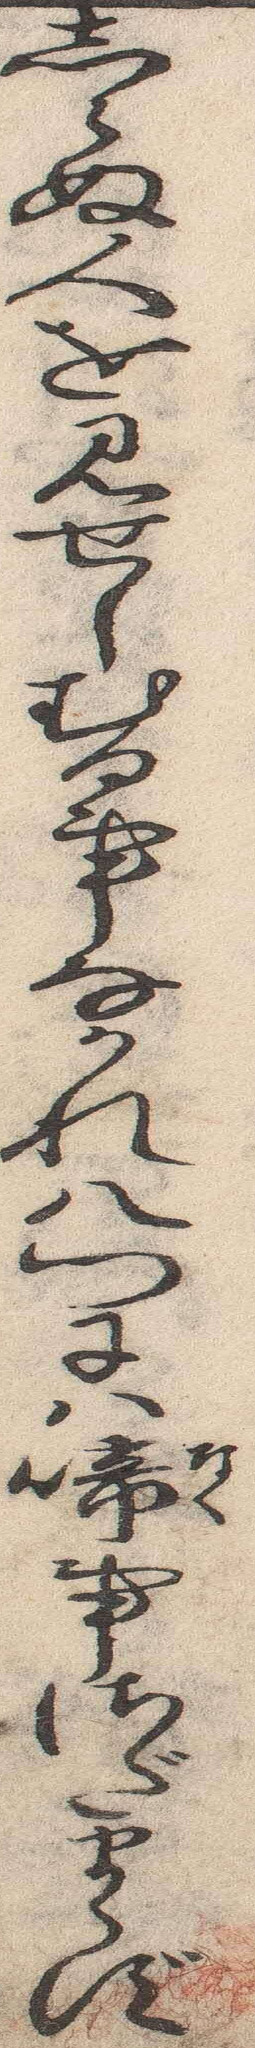しらぬ人を見せしむる事なかれ八つには啼事さだまらず
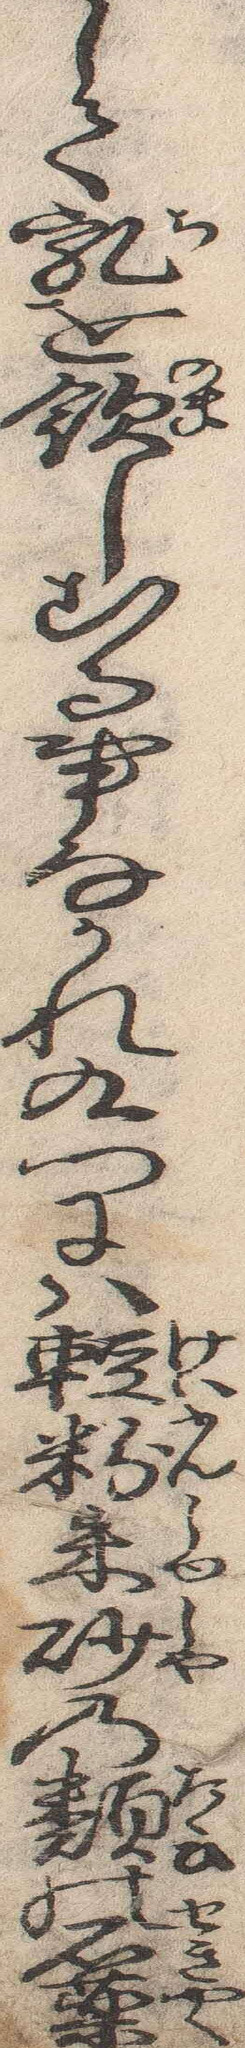して乳を飲しむる事なかれ九つには輕粉朱砂の類の石薬
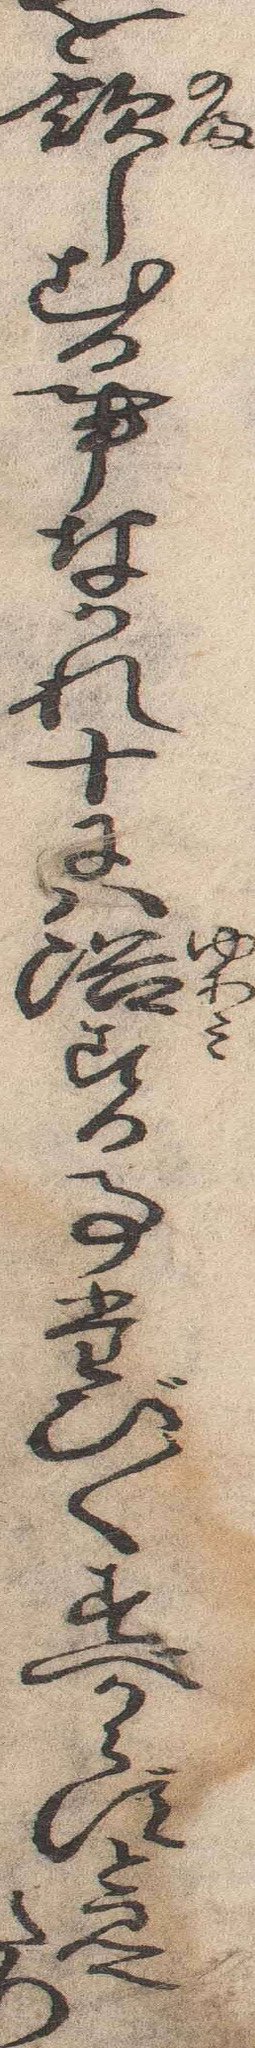を飲しむる事なかれ十には浴する事たび〳〵すべからずと見えたり

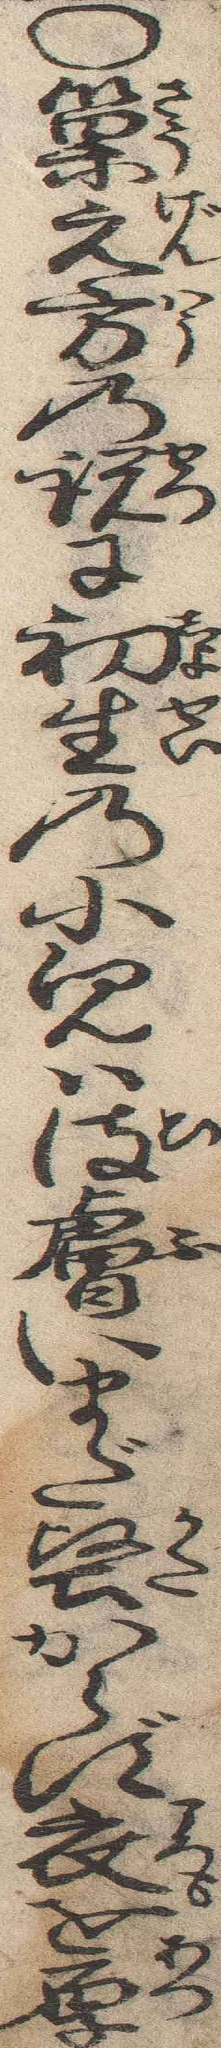◯巣元方の説に初生の小児は皮膚いまだ堅からず衣を厚
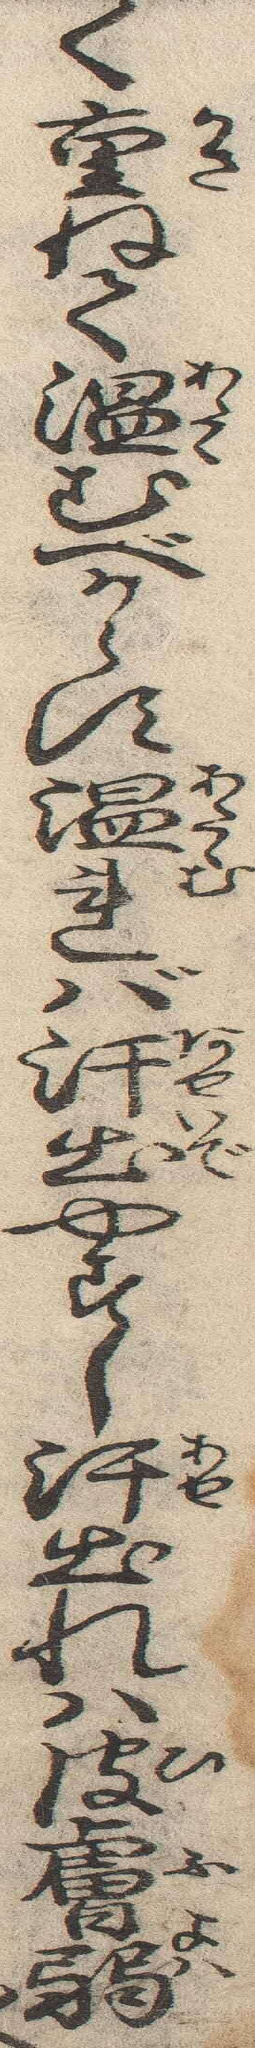く重ねて温むべからす温れば汗出やすし汗出れは皮膚弱く
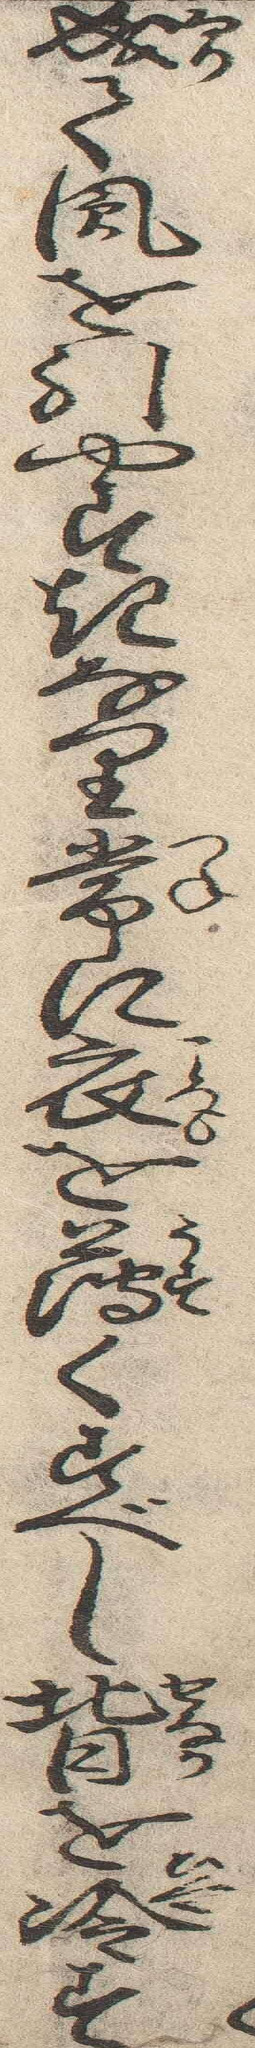成て風を引やすきなり常に衣を薄すべし背を冷す
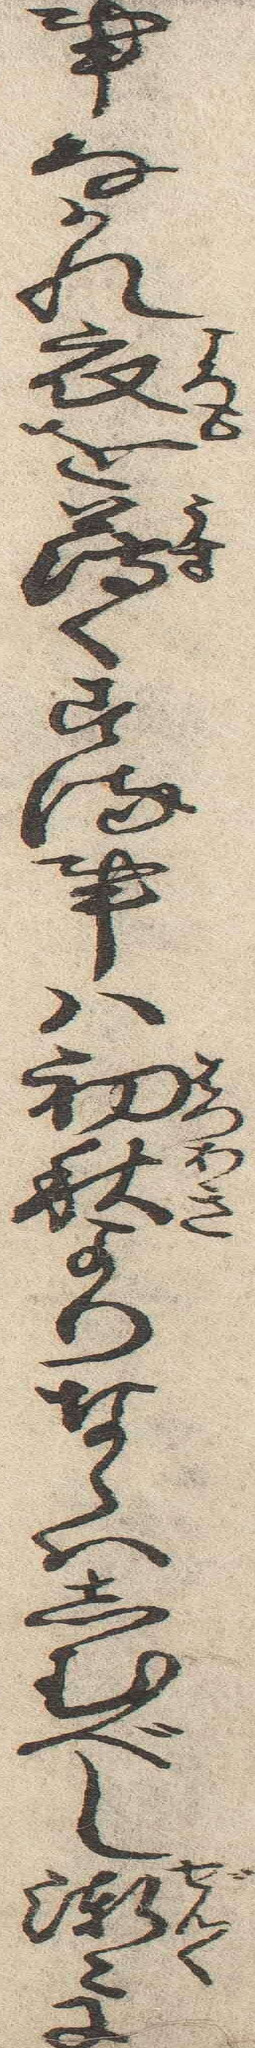事なかれ衣を薄くする事は初秋よりならはしむべし漸〻に
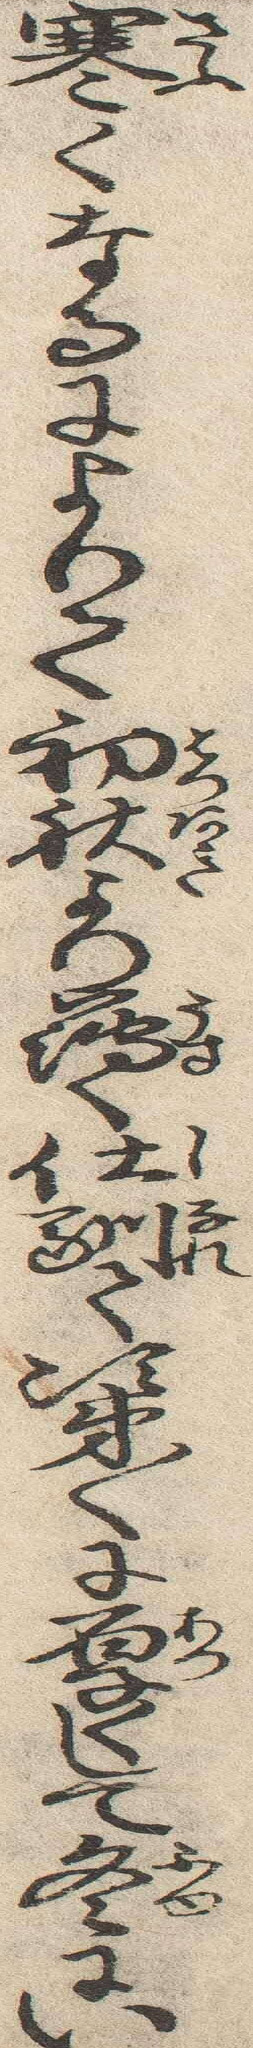寒くなるによりて初秋より薄く仕馴て次第〳〵に厚くして冬にい
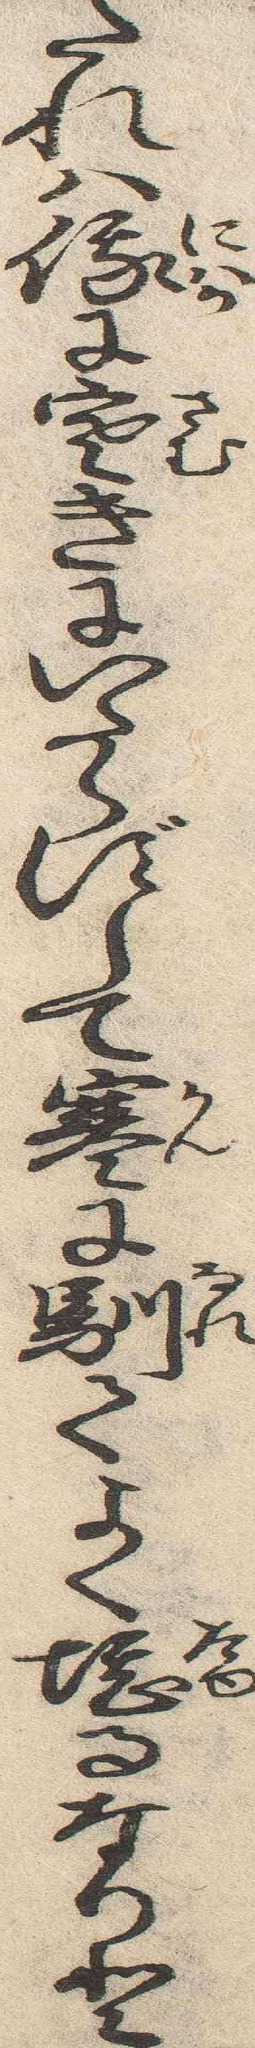たれは俄に寒きにいたらずして寒に馴てよく堪るなりと
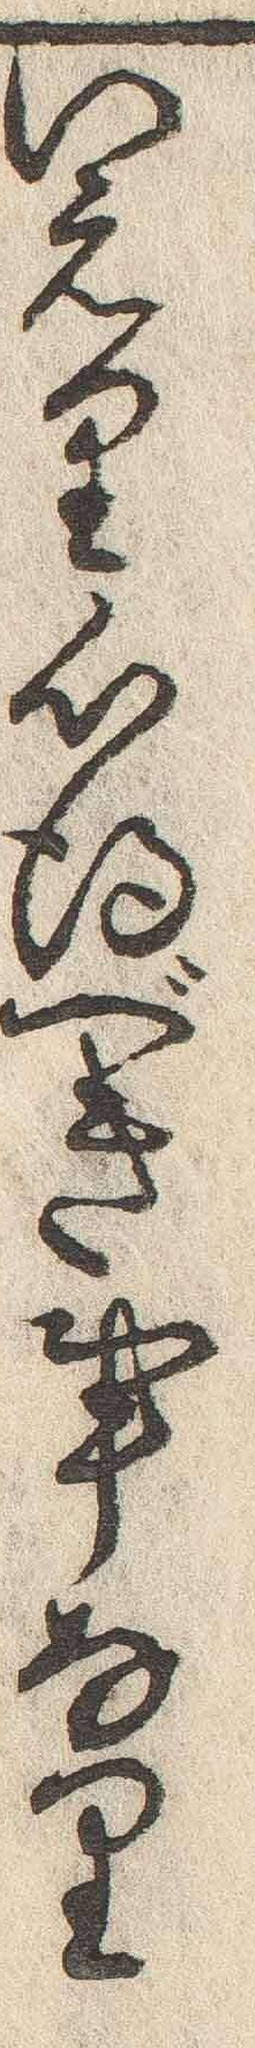いえり心得べき事なり
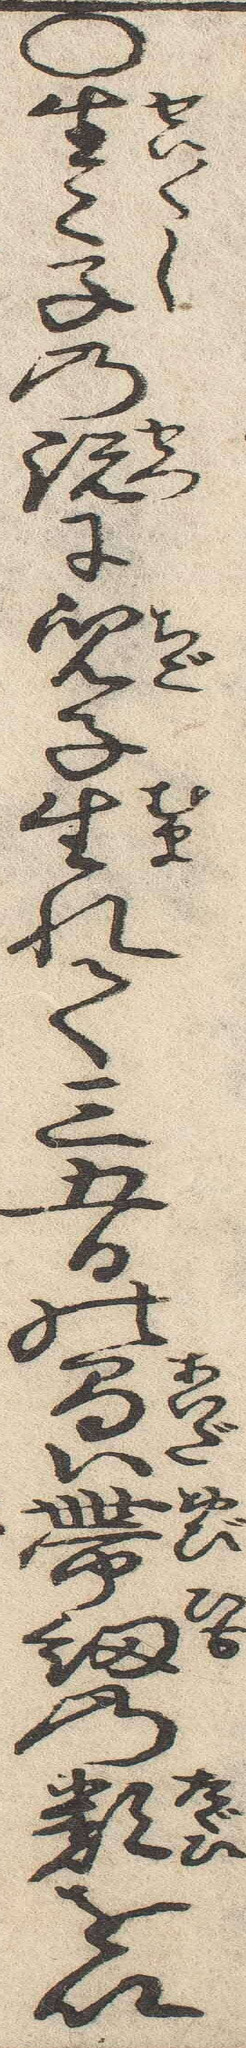◯生〻子の説に児子生れて三五日の間は帯紐の類を以
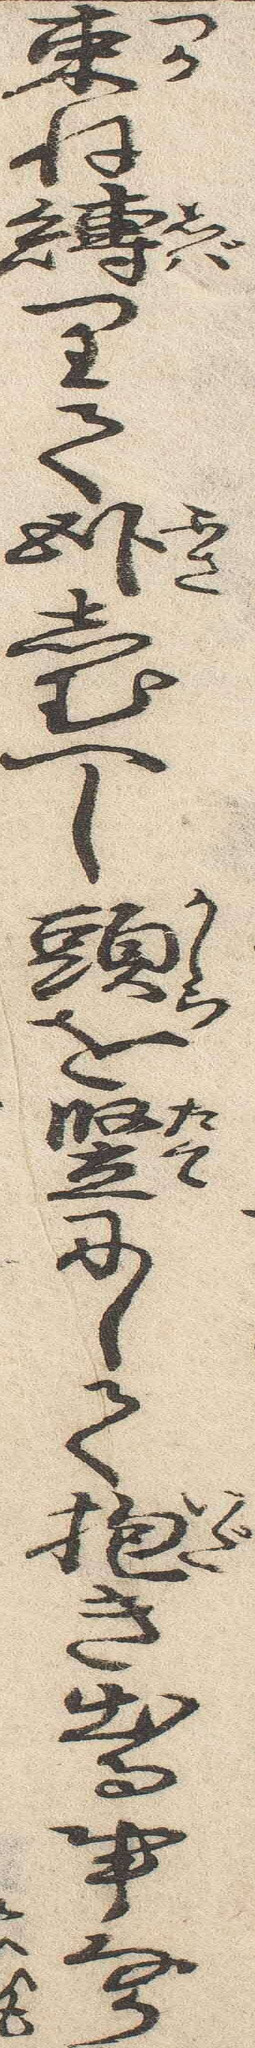束ね縛りて臥しむへし頭を竪にして抱き出る事なか
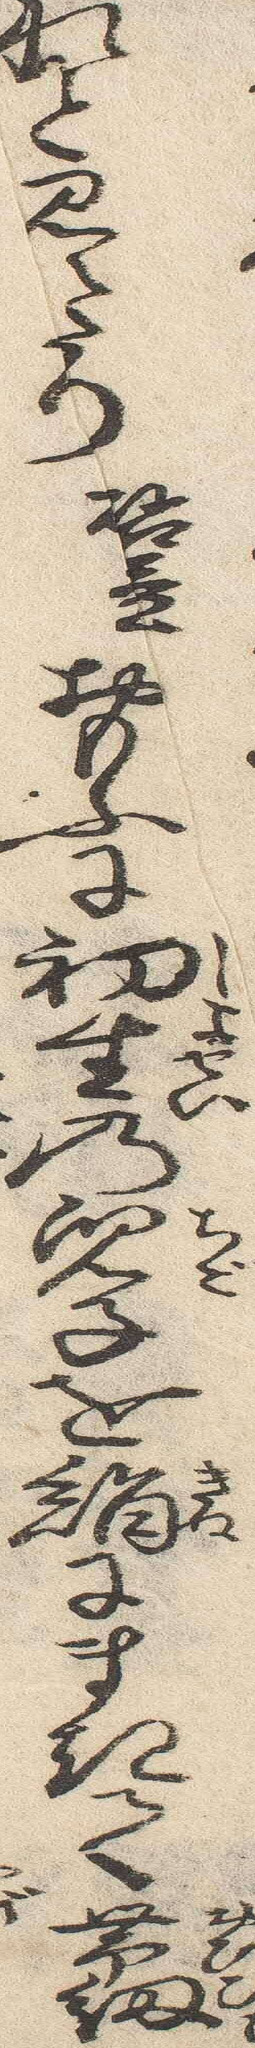れと見えたり啓益おもふに初生の児子を絹にまきて帯紐
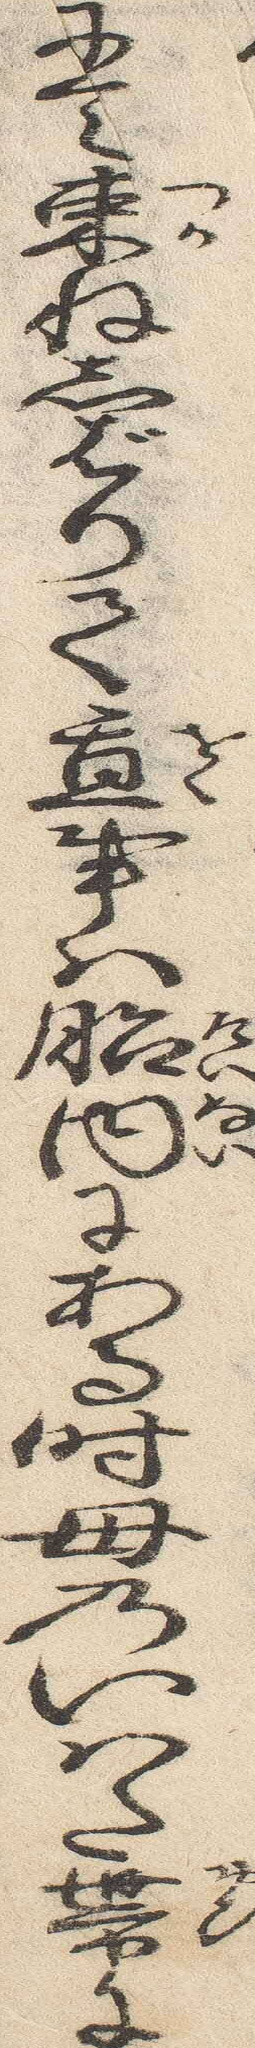にて束ねしばりて置事は胎内にある時母のいはた帯に
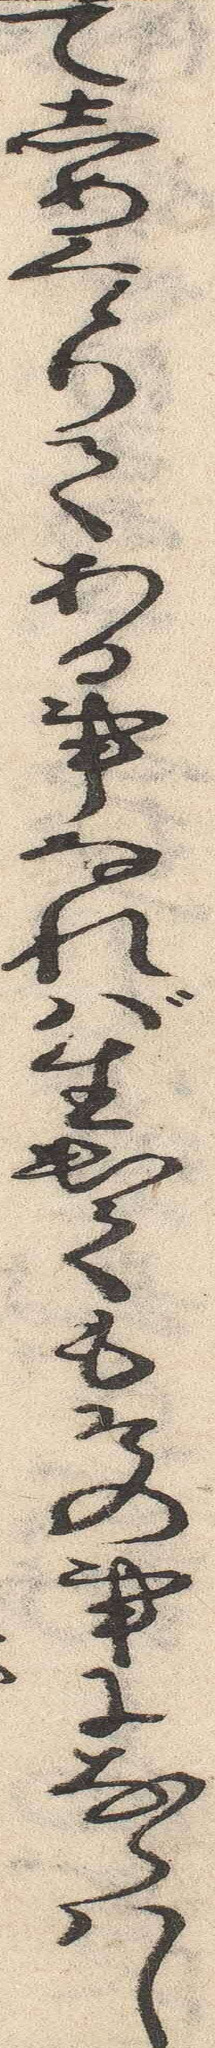てしめくゝりてある事なれば生出てもその事にならはし
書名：小児必用養育草
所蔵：東京学芸大学附属図書館 国文学研究資料館
